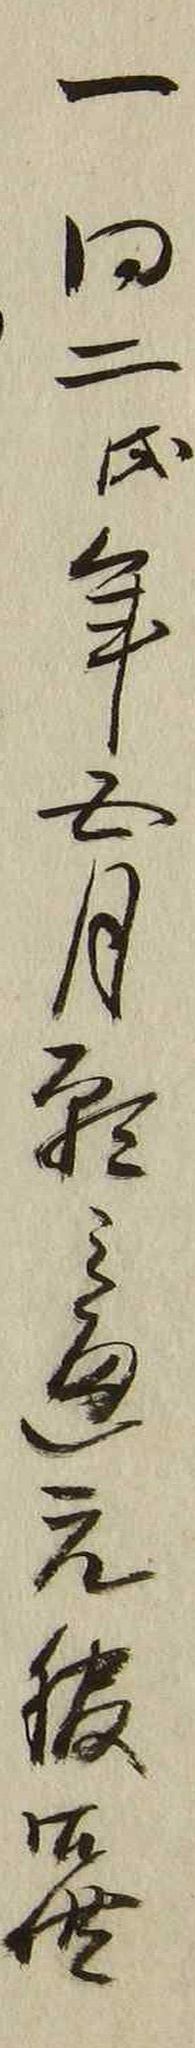一同二戌年五月願之通元服御供
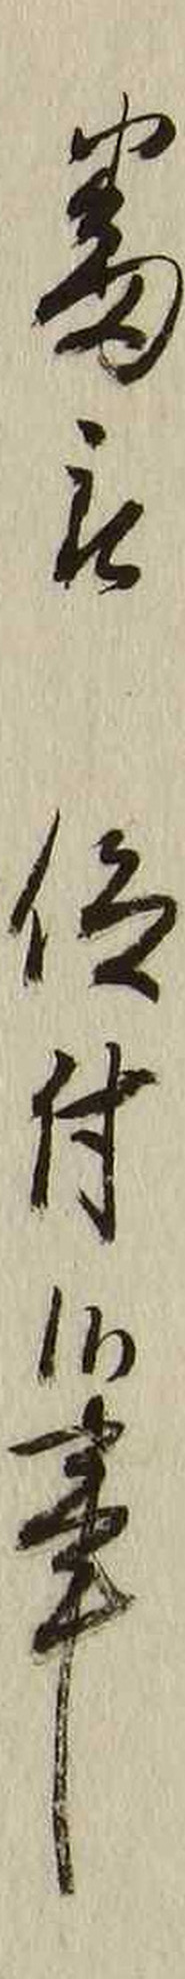番被仰付候事
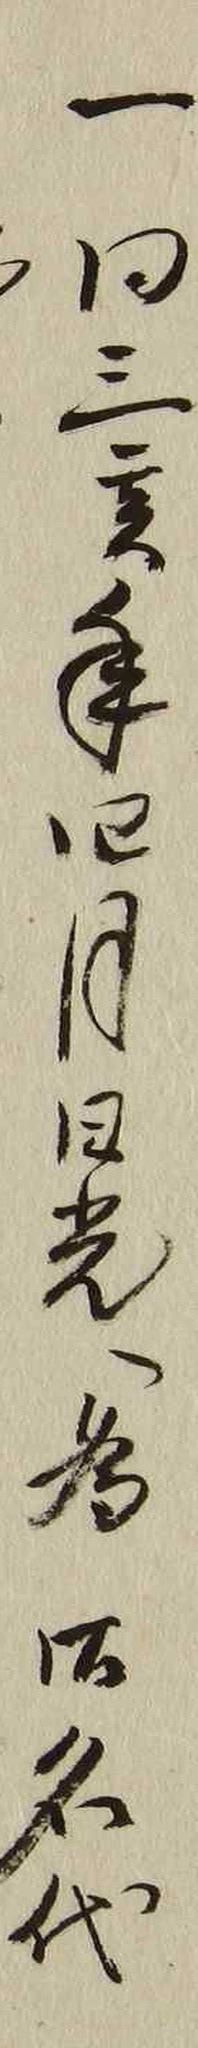一同三亥年四月日光へ為御名代
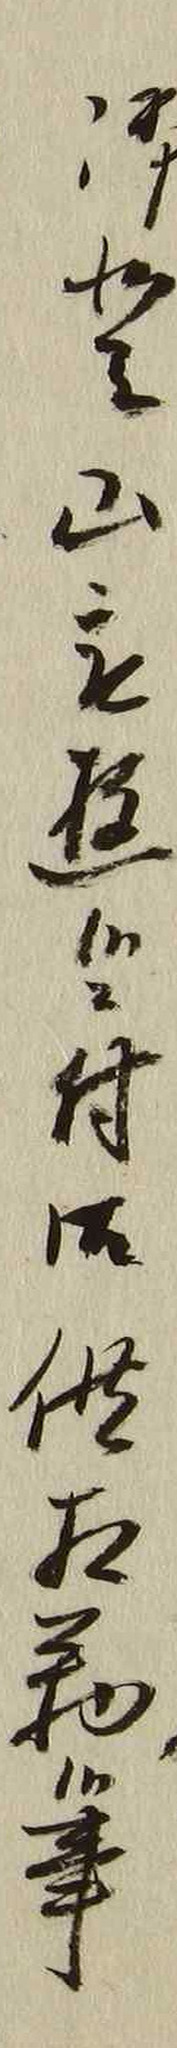御登山被遊候ニ付御供相勤候事
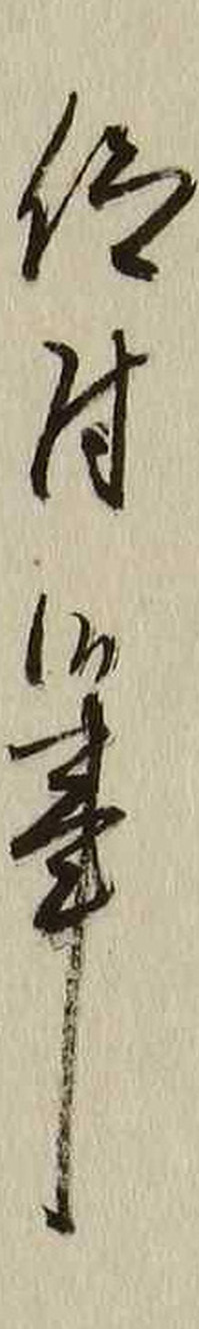仰付候事
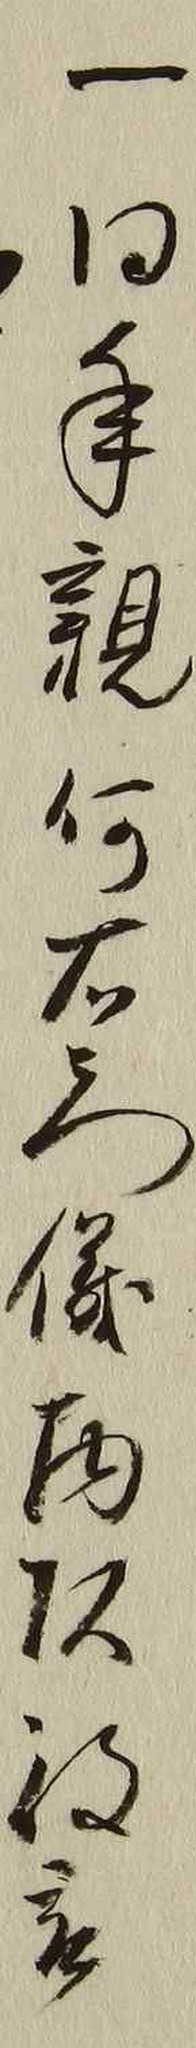一同年親何右衛門儀物頭役被
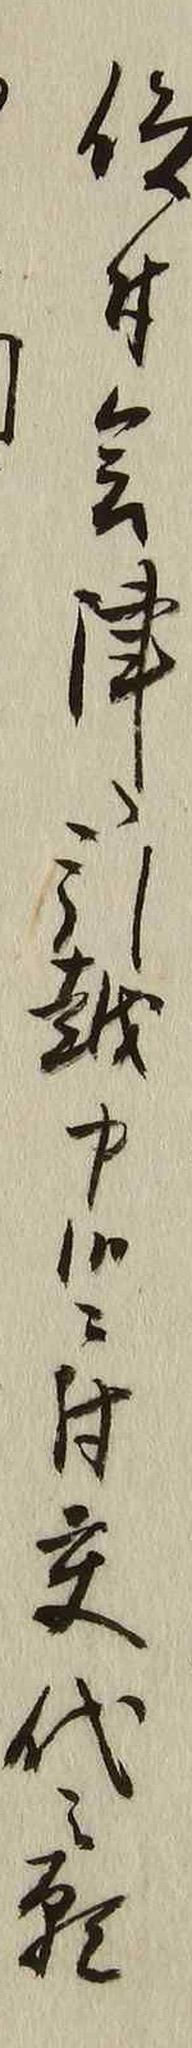仰付会津へ引越申候ニ付交代之願
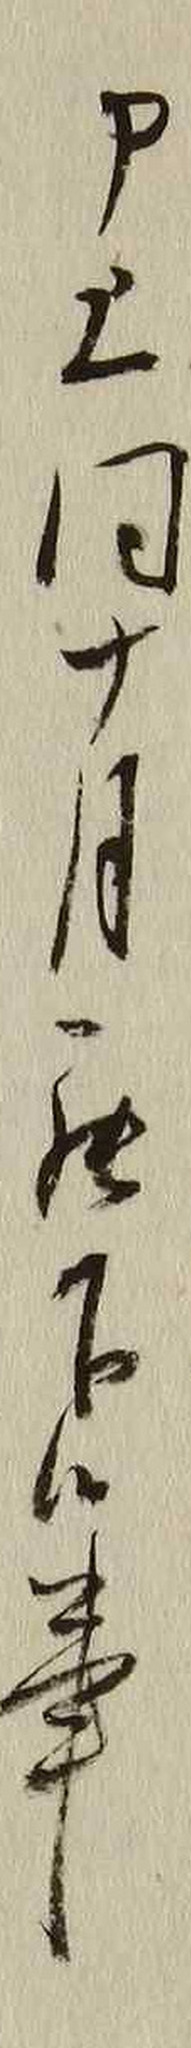申上同十月罷下候事
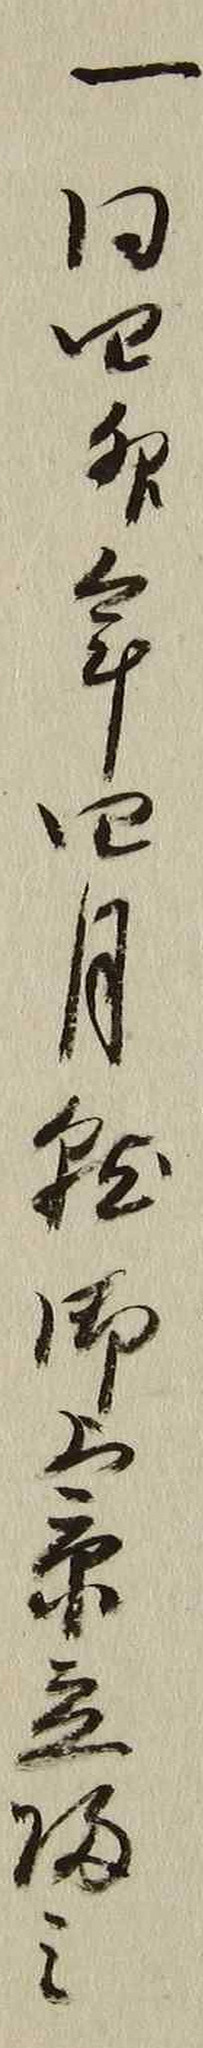一同四卯年四月就御上京立帰之
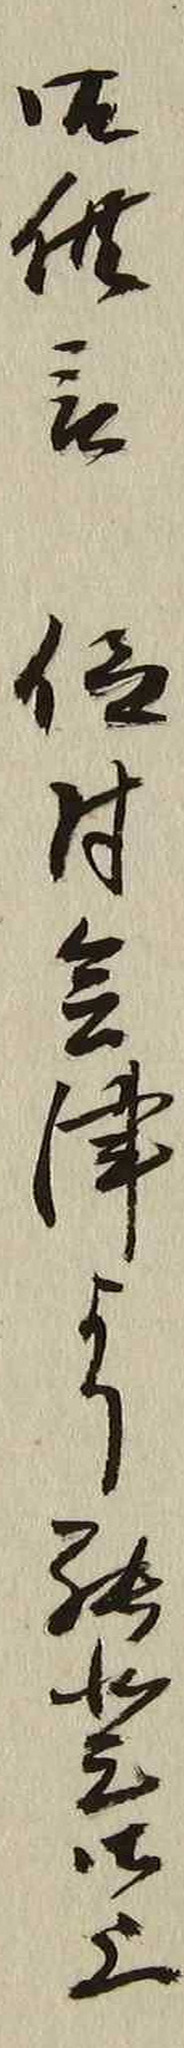御供被仰付会津より罷登御上
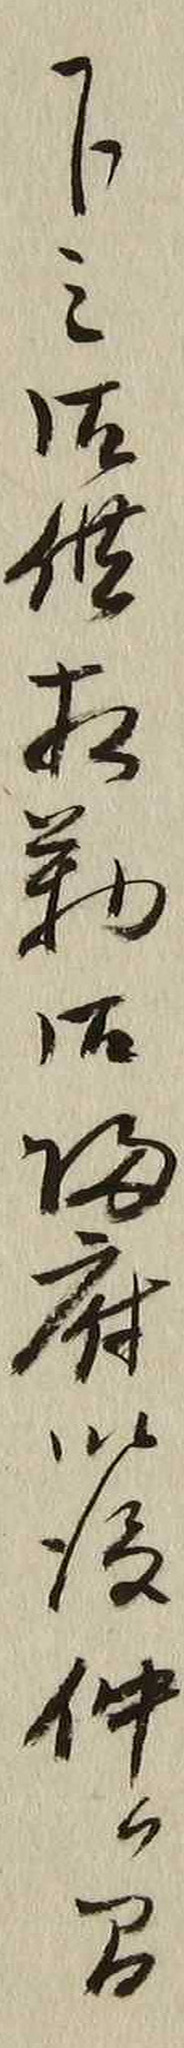下之御供相勤御帰府以後仲ケ間
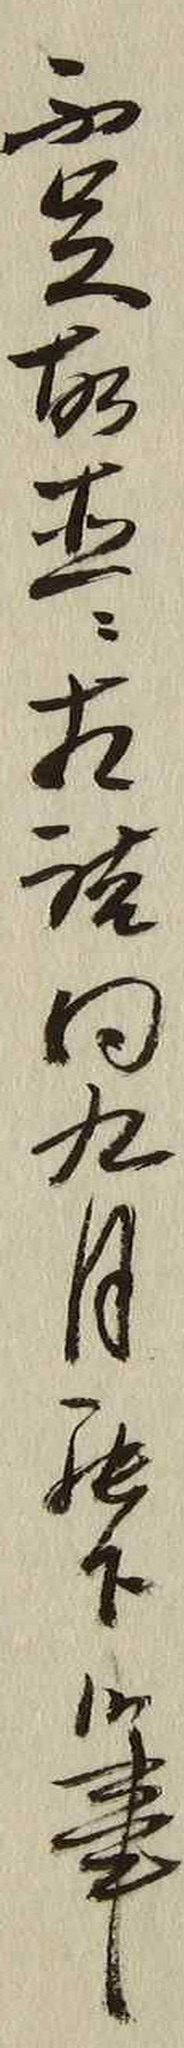不足故直ニ相詰同九月罷下候事
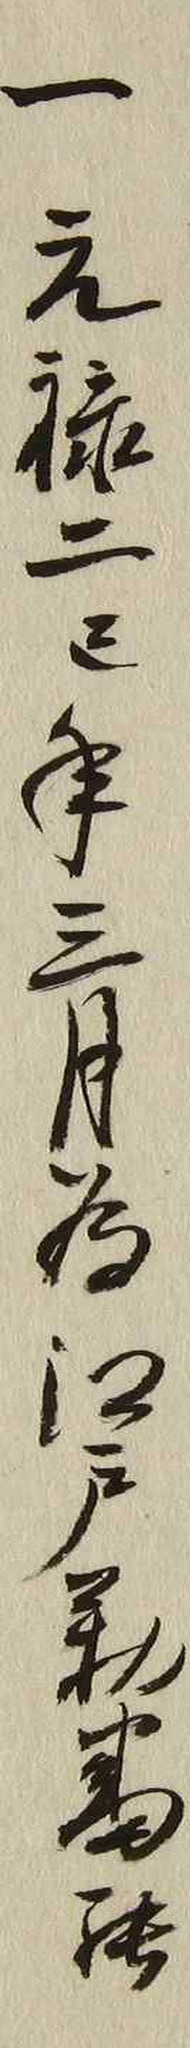一元禄二巳年三月為江戸勤番罷
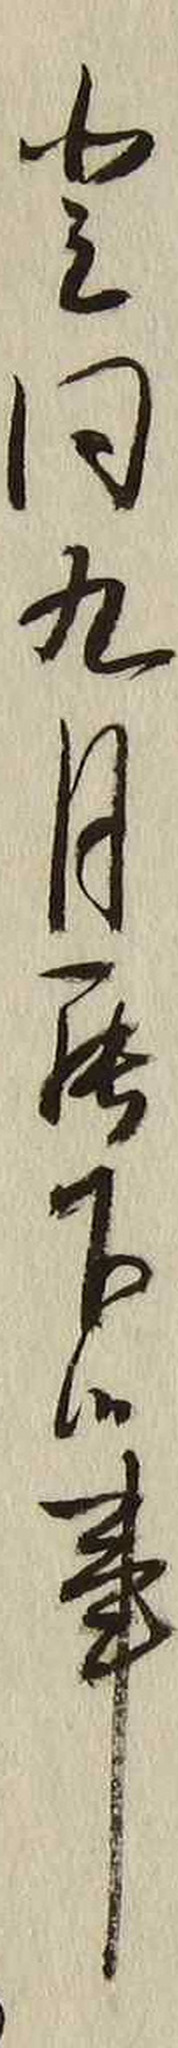登同九月罷下候事
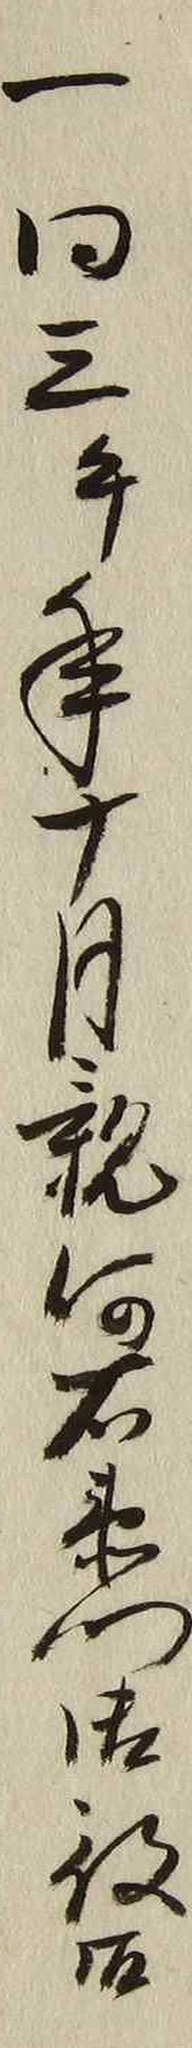一同三午年十月親何右衛門御役御
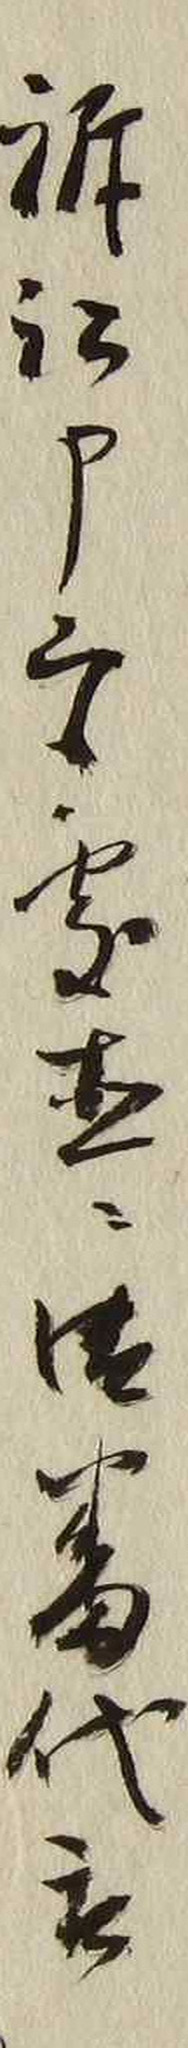訴訟申上候処直ニ御番代被
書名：諸士系譜　巻之349　も之部5
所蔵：会津若松市立会津図書館
